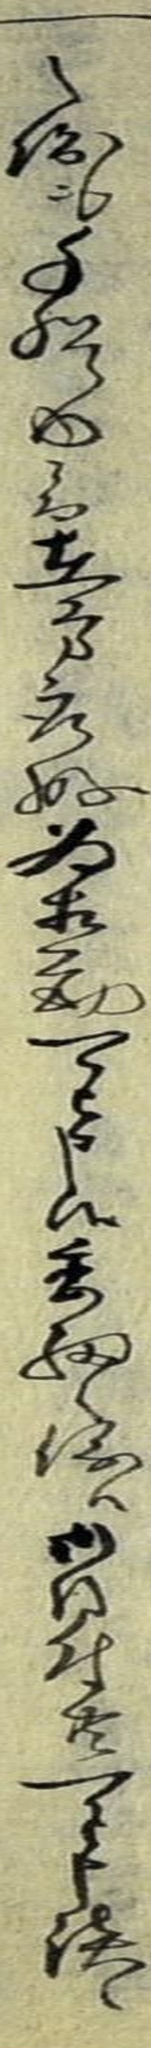之儀も手組之内に而在方取扱為相勤可被申候委細之儀は御目付共可被申談候
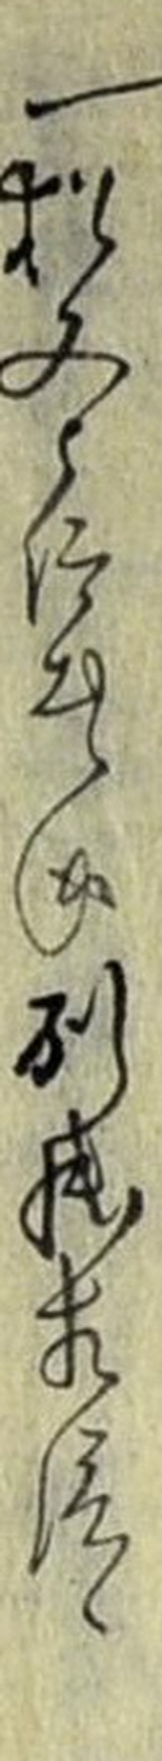猶又被仰出候趣別紙相渡候
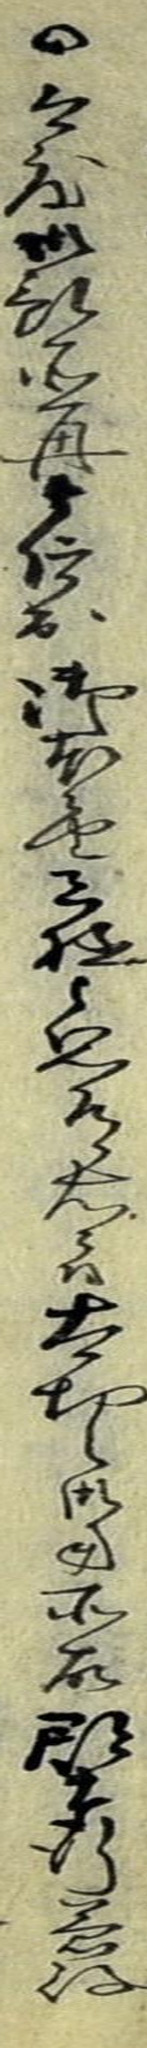〇今度御預所再被仰出御本望至極被思召候右に付太切之御用所故郡奉行兼役
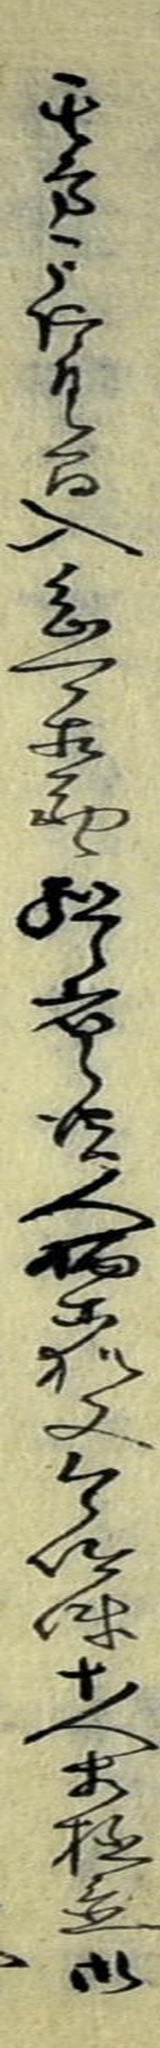其方へ被仰付候間入念可相勤候組之者之儀は人柄等猶又令吟味十人相極置御
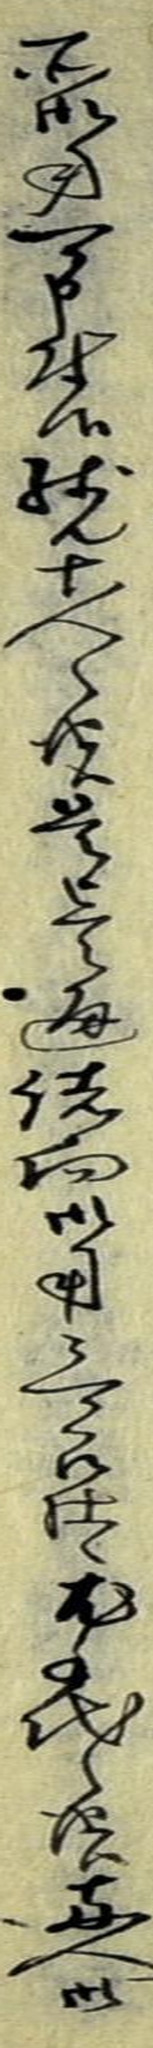所御用可申付候残る十人之儀は是迄之通諸向御用に可召仕候尤手代之儀は両人御
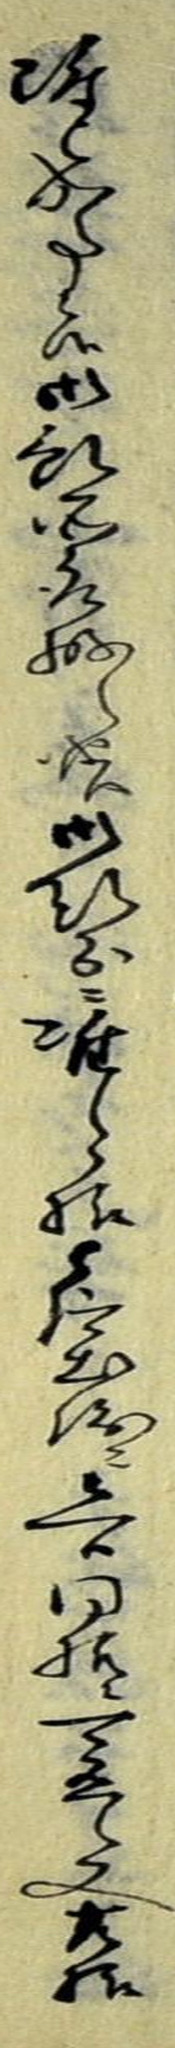附被成事に候御預所取扱之儀は御領分に准し候様被仰出儀に候へは同様に可有之又左様

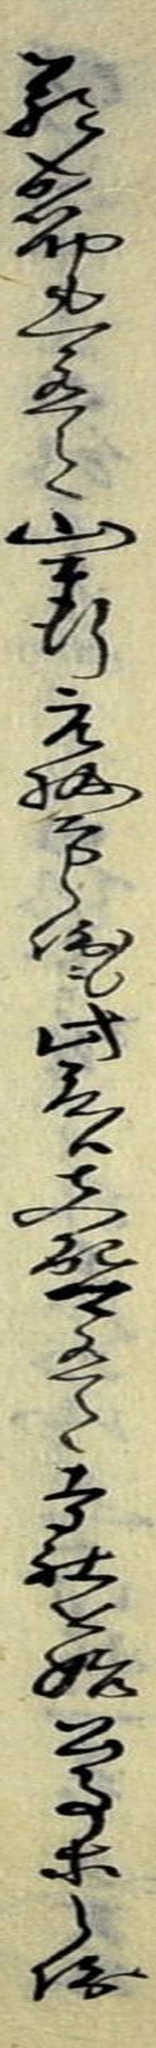難成筋も可有之候山奉行取扱方之儀も此度は支配可有之候寺社を始公事等之儀
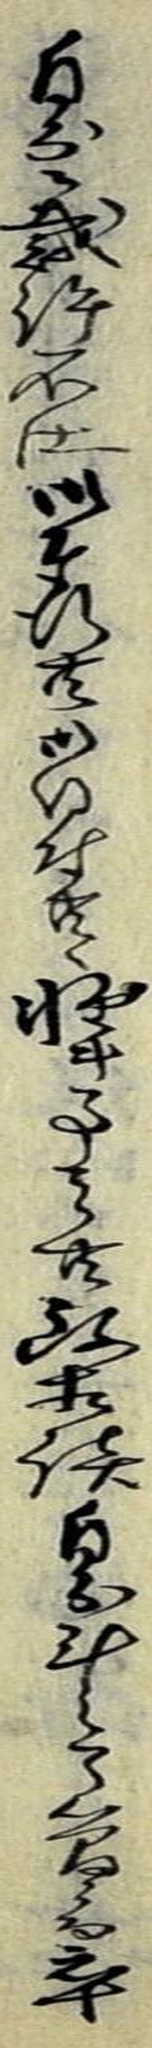自分に裁許不仕御奉行共御目付共へ軽き事に候共致相談自分斗之了簡に而卒
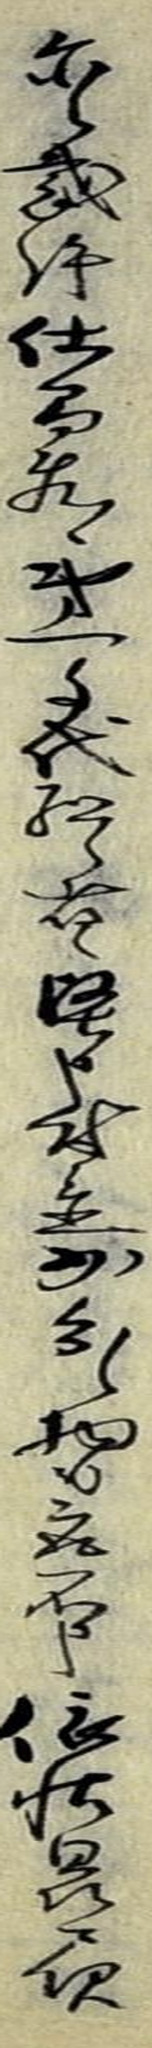爾之裁許仕間敷候第一手代組之者へ堅申付置少分之物も取不申依怙贔屓
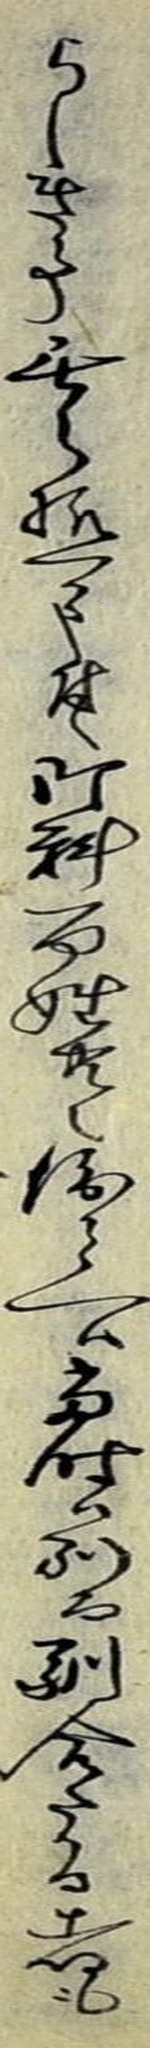らしき事無之様可申付候御料百姓共之儀に候へは当時は別而馴合たる者も
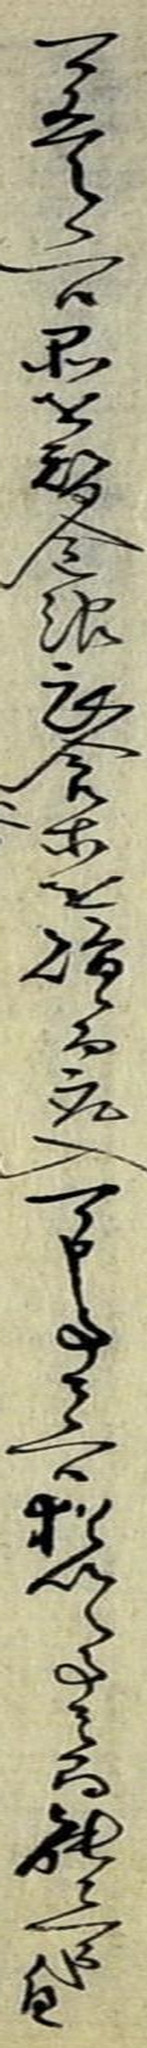可有之候へは品を替金銀衣食等を贈候而取入可申事に候へは猶以之事に候間能々可申付候
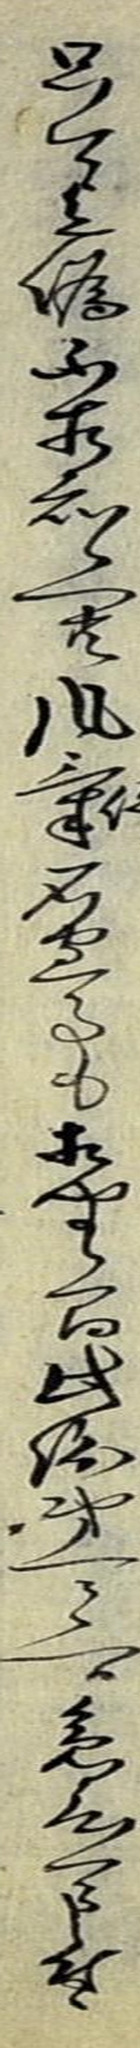只今迄偽不相知候へ共風気不宜事も相聞候間此儀第一に候へは急度可申付候
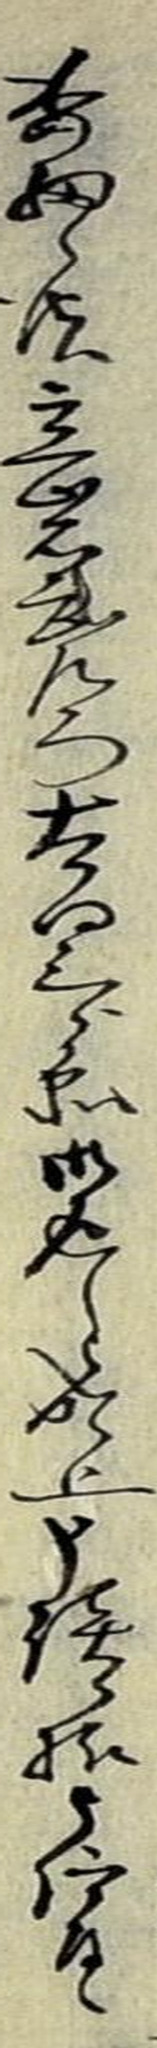委細之儀立岩武左衛門太田三郎兵衛御返し被成候上申談候様被仰付候
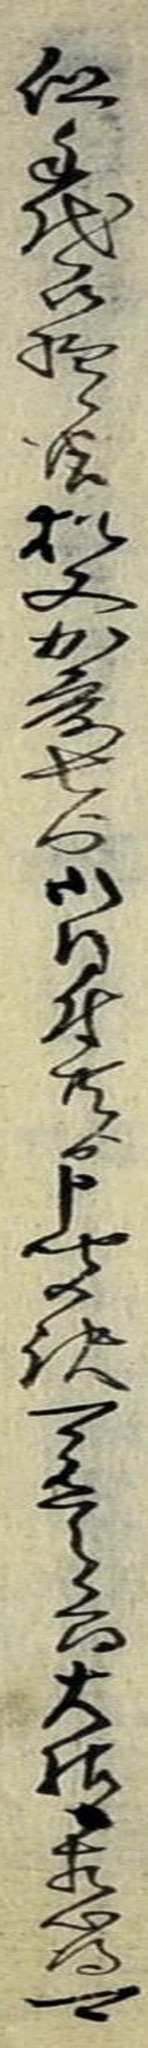但手代召抱候儀は猶又加藤七右衛門御目付共ゟ申聞訳可有之候間大様相心得可
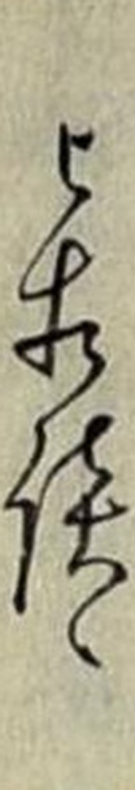被相談候
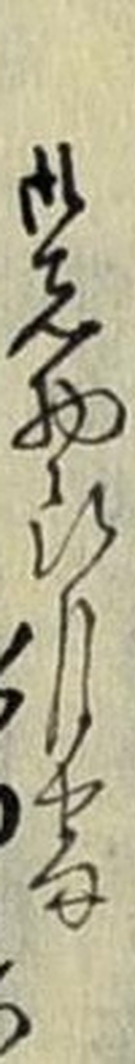御先物頭月番
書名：命令之部 二
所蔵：福井県文書館 Fukui Prefectural Archives
